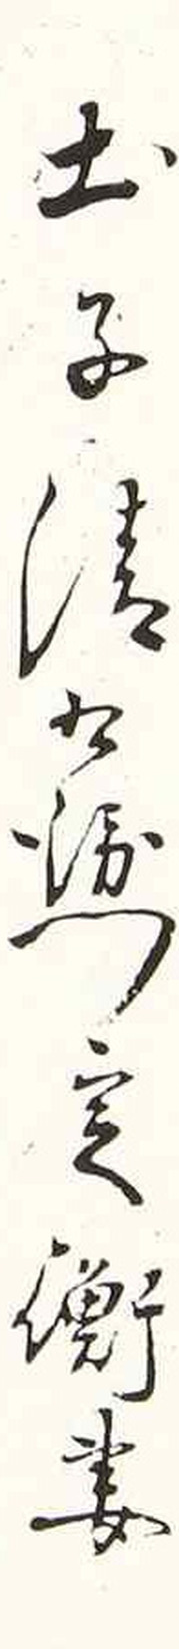女土子清右衛門定衝妻
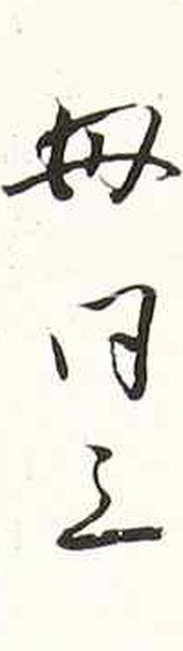母同上
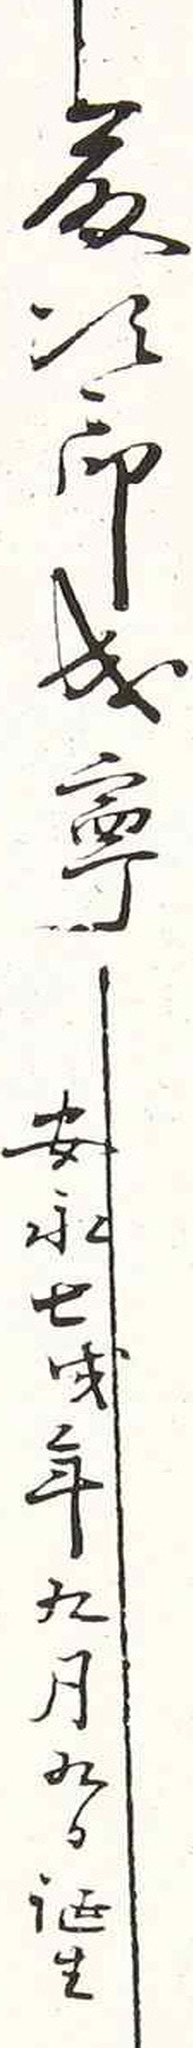藤次郎成寧安永七戌年九月九日誕生
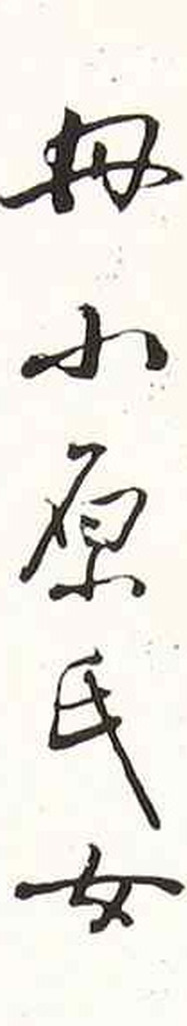母小原氏女
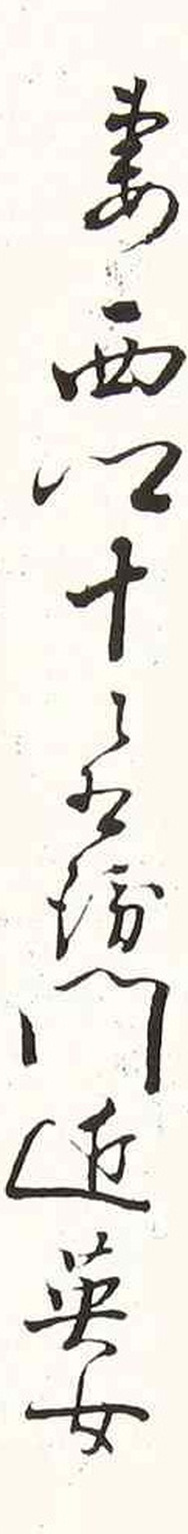妻西郷十郎右衛門近英女
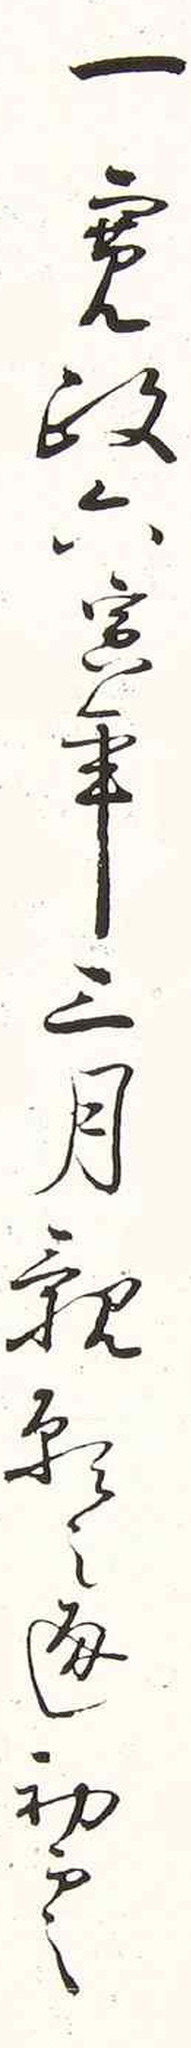一寛政六寅年三月親願之通初而之
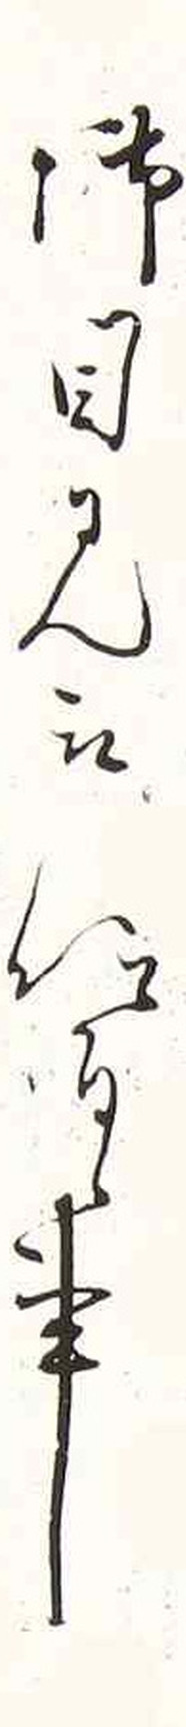御目見被仰付候事
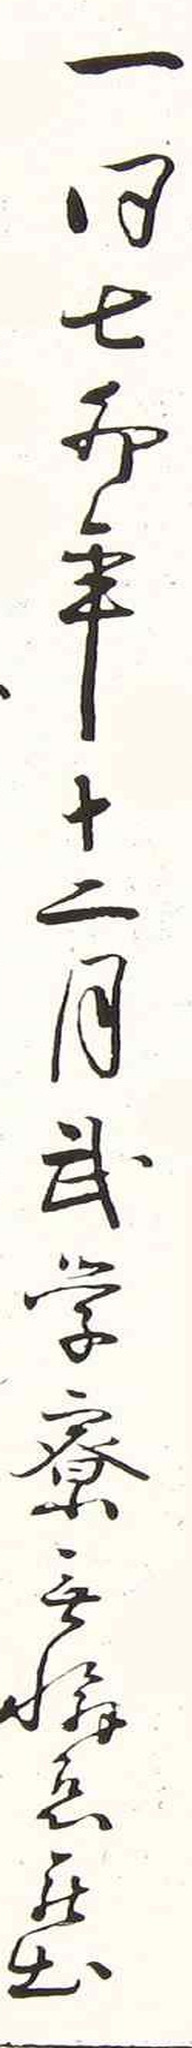一同七卯年十二月武学寮無懈怠罷出
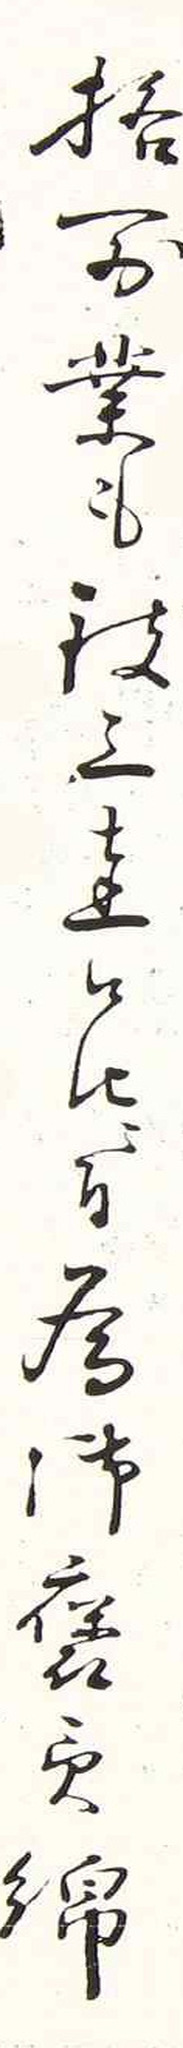格別業も致上達候由ニ付為御褒美綿
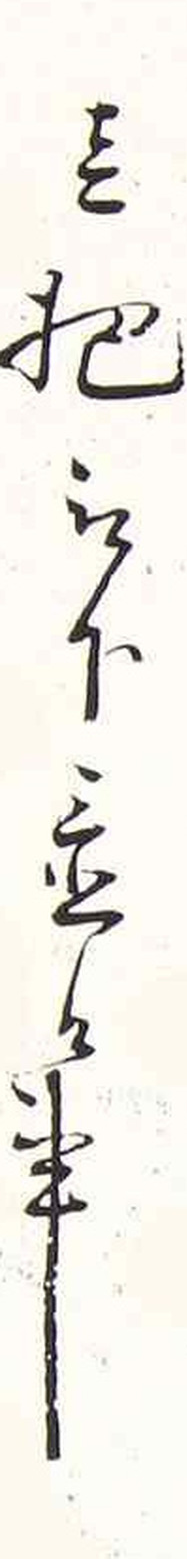壱把被下置候事
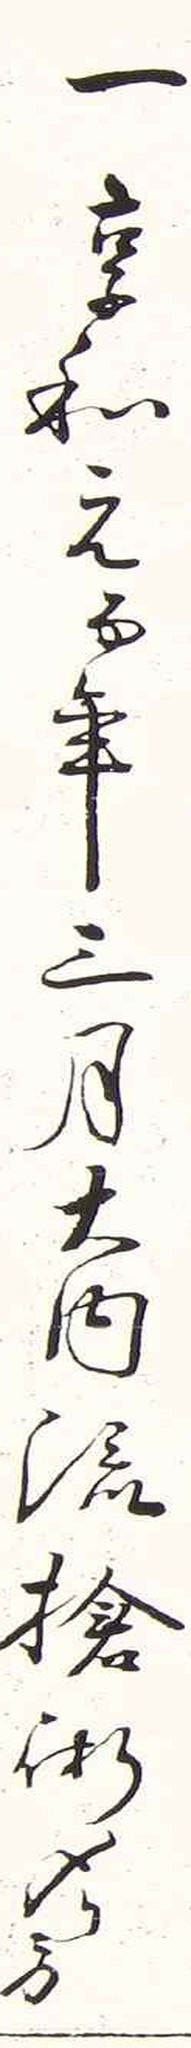一享和元酉年三月大内流槍術〆り方
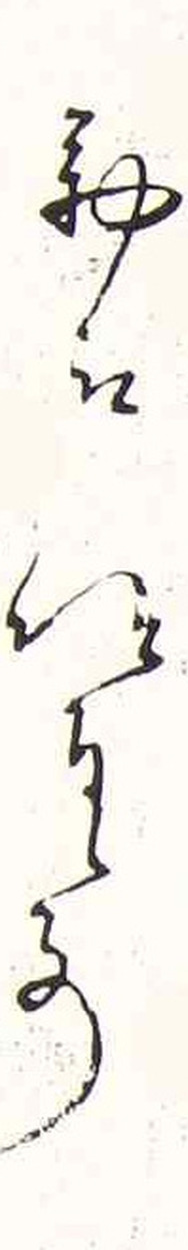勤被仰付候事
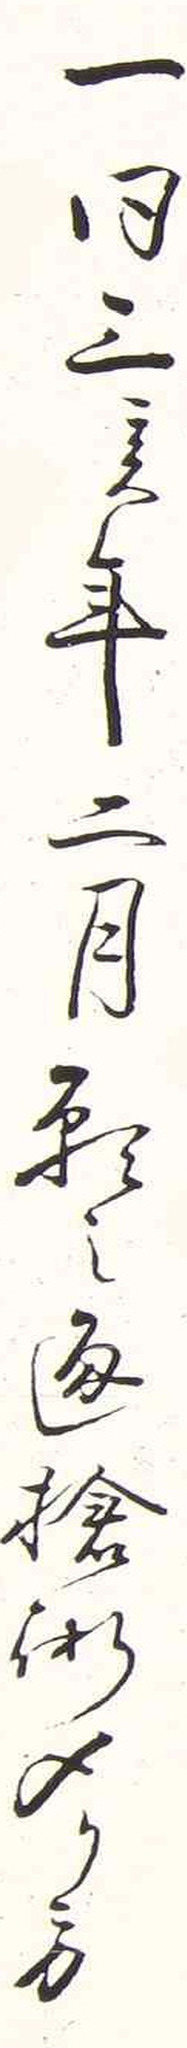一同三亥年二月願之通槍術〆り方

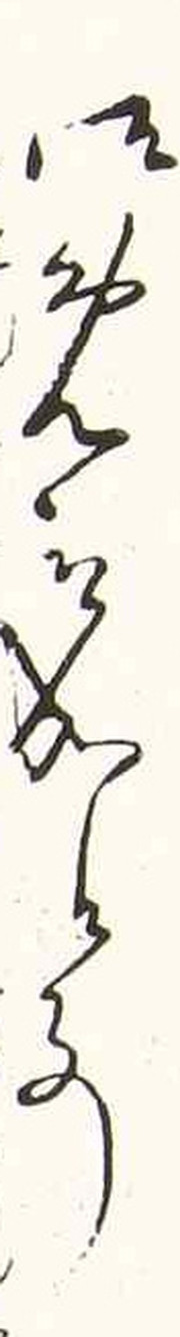御免被成候事
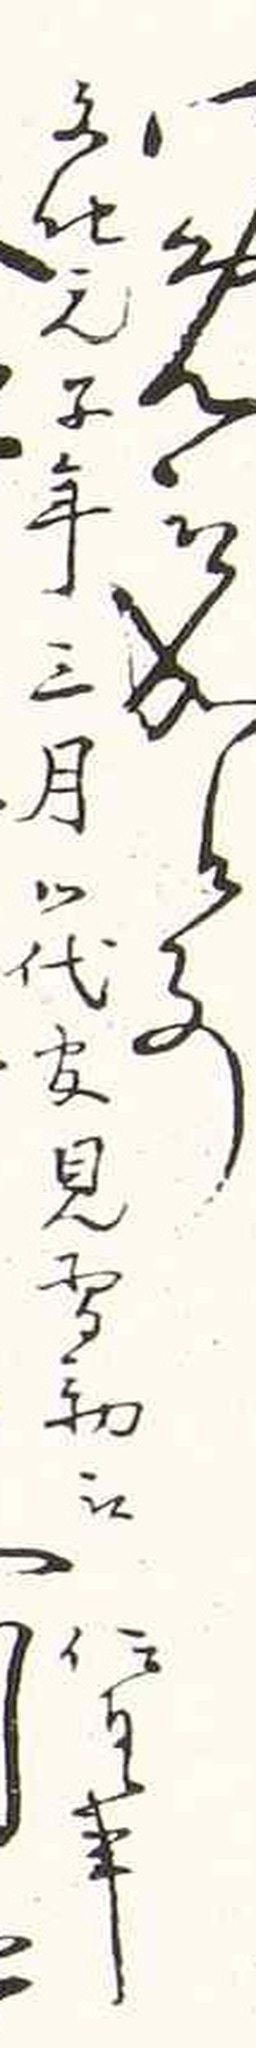一文化元子年三月御代官見習勤被仰付候事
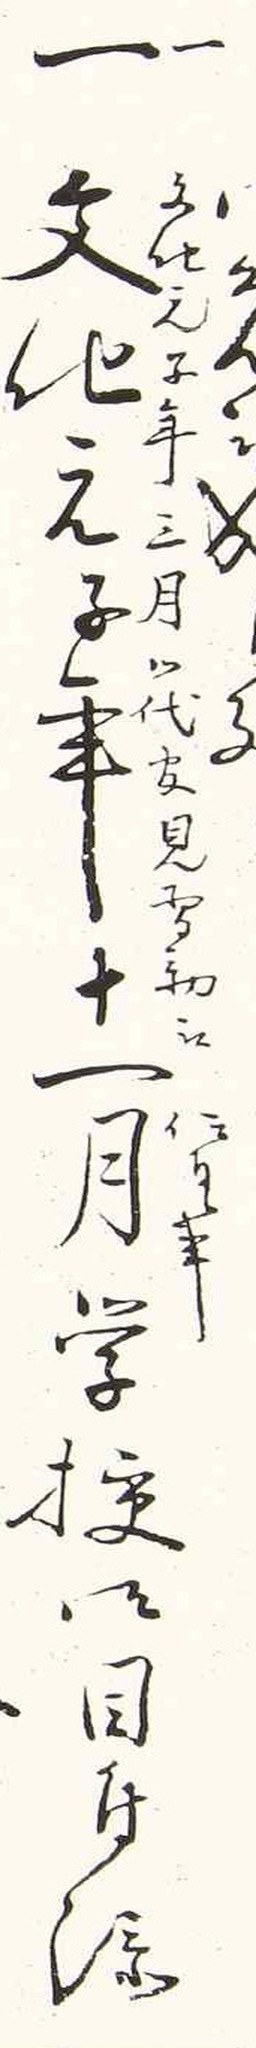一文化元子年十一月学校御目付添
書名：諸士系譜　巻之357　す之部7
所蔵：会津若松市立会津図書館
